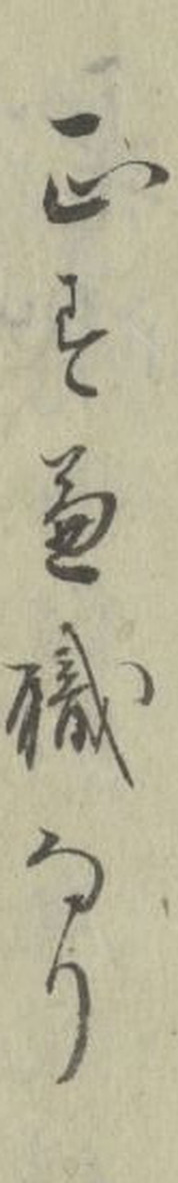正す兼職なり
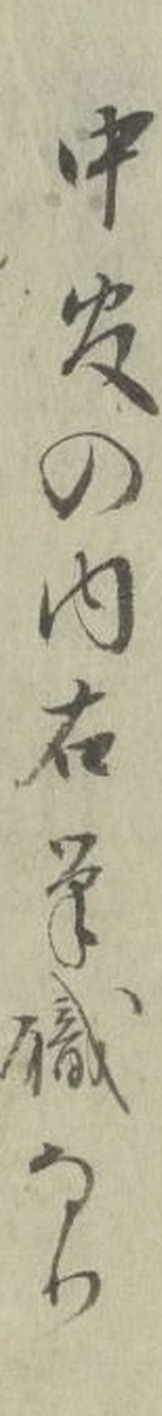中官の内右筆職なり

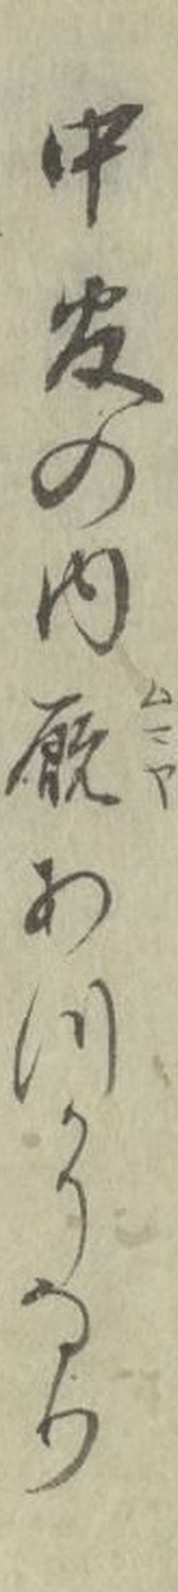中官の内厩あつかりなり
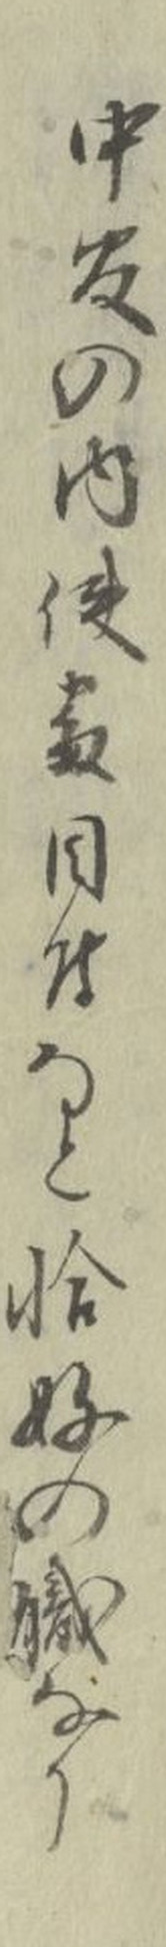中官の内使番目付なと恰好の職なり
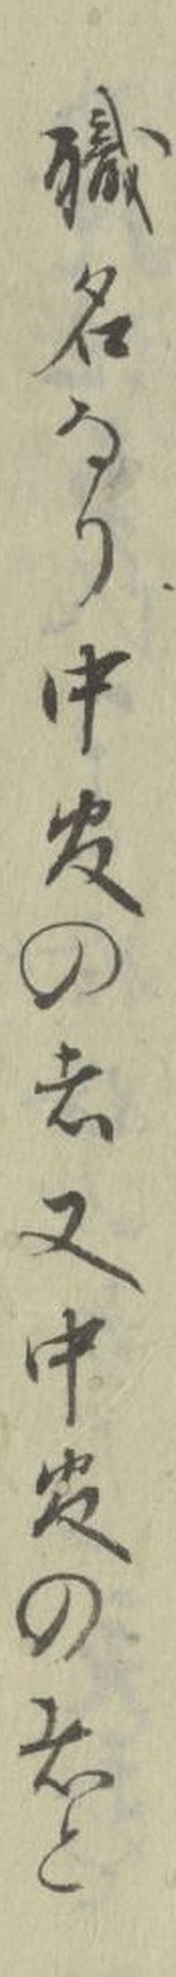職名なり中官の者又中官の者と
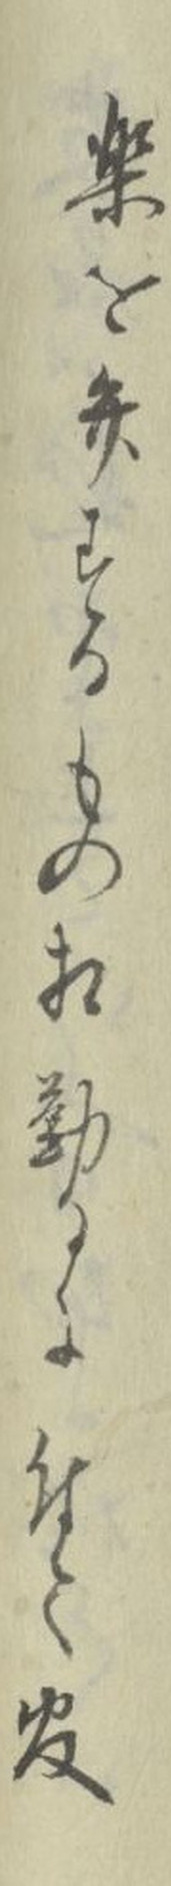楽を弁するもの相勤るに付て官
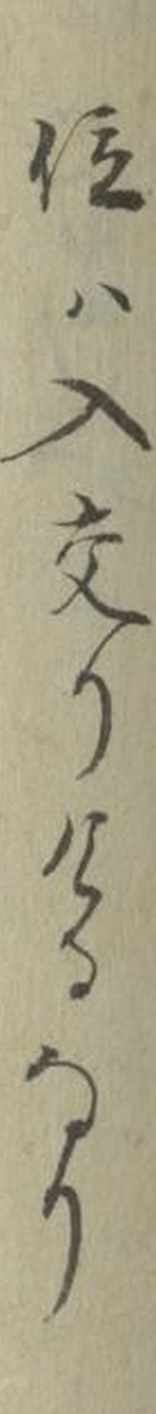位は入交りけるなり
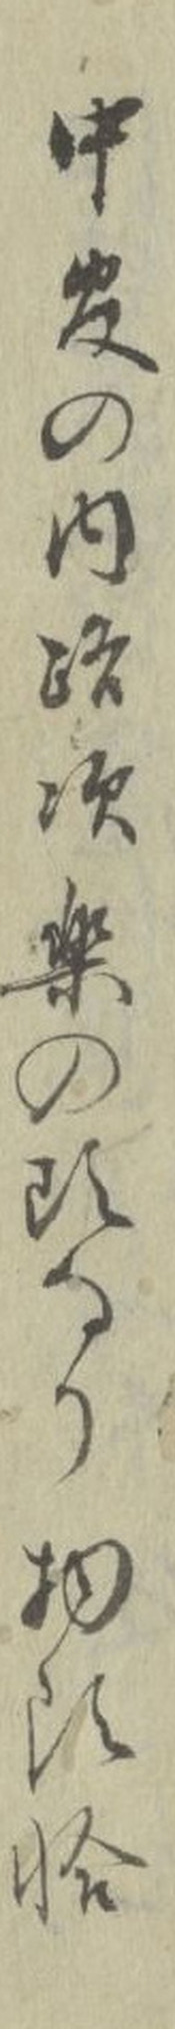中官の内路次楽の頭なり物頭恰
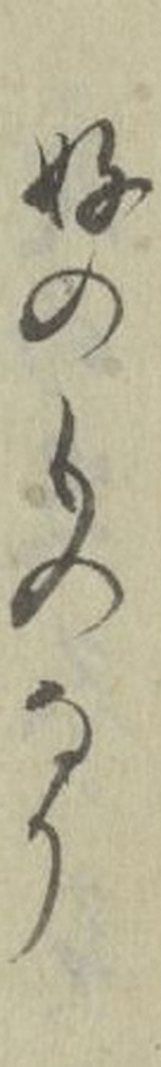好のものなり

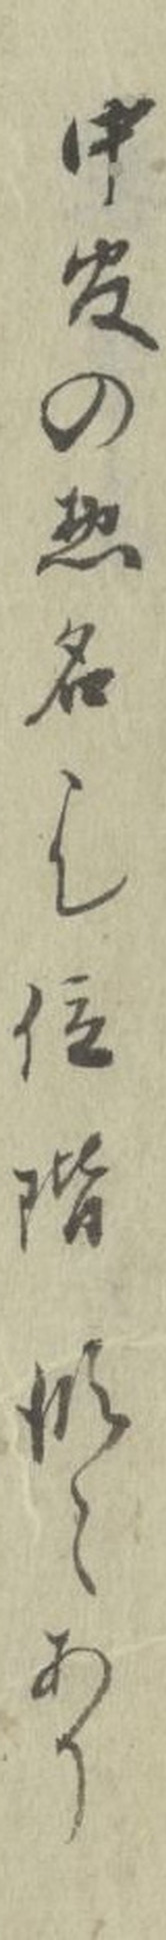中官の惣名にて位階順々あり
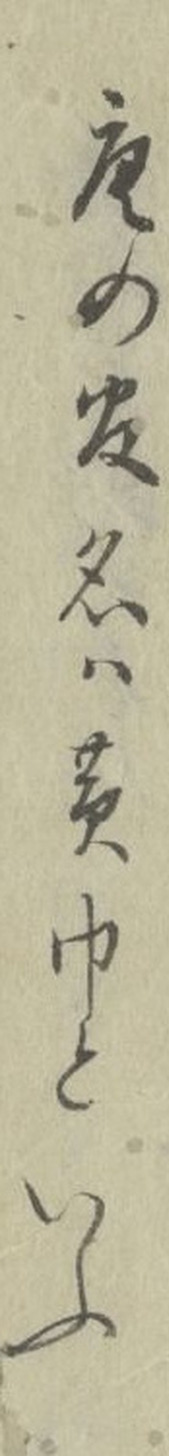唐の官名は黄巾といふ
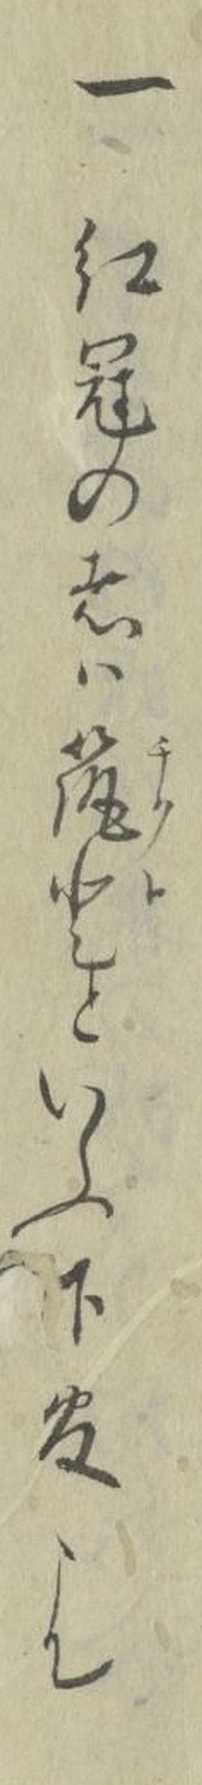一紅冠の者は筑登といふ下官にて
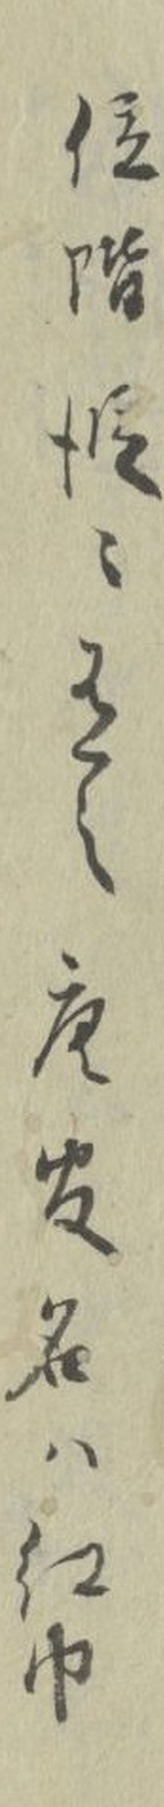位階段々有之唐官名は紅巾
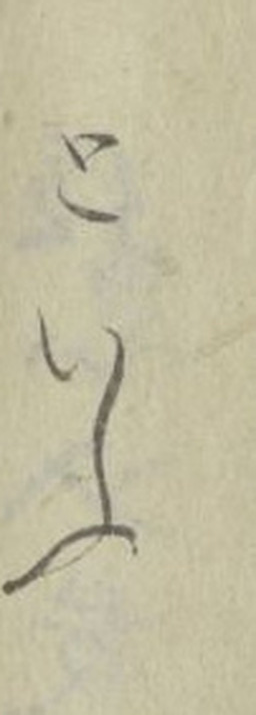といふ
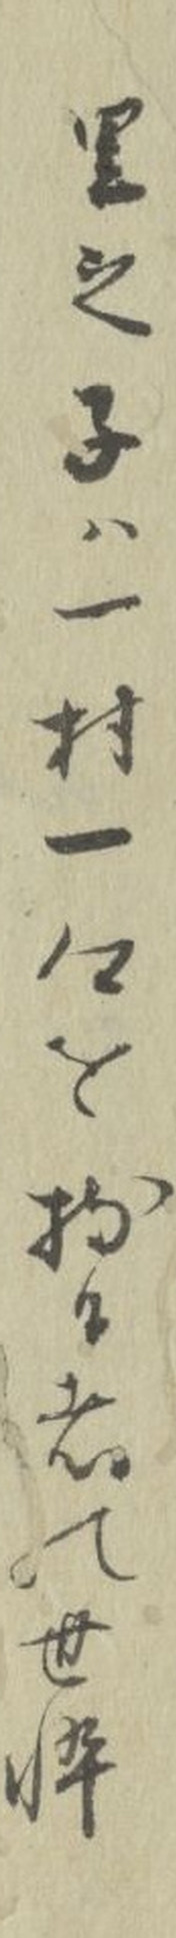里之子は一村一里を持る者の世倅
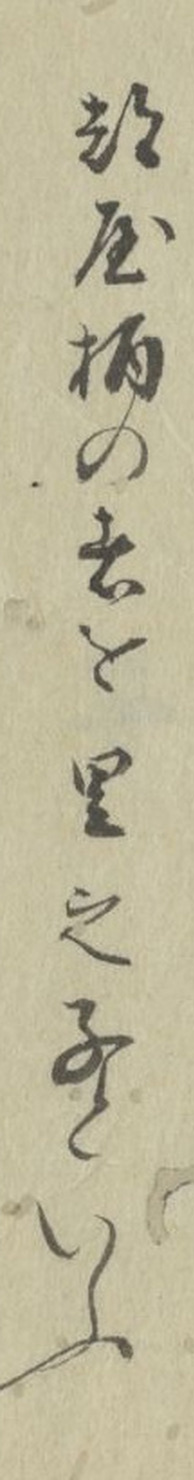部屋柄の者を里之子といふ
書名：琉球来朝記 自一至七
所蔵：University of the Ryukyus Library
